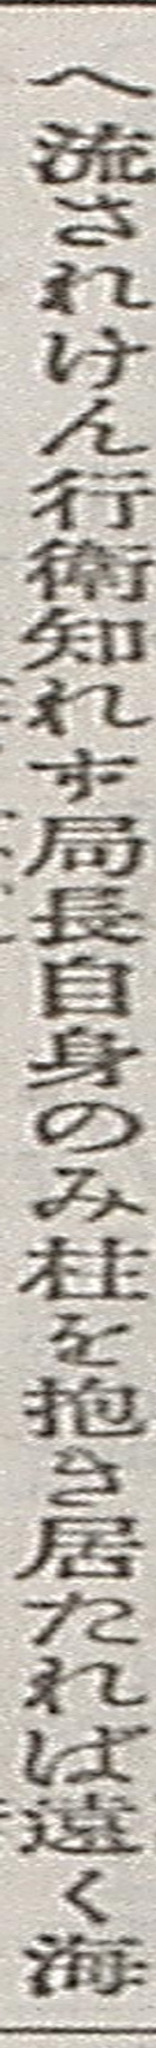へ流されけん行衛知れず局長自身のみ柱を抱き居たれば遠く海
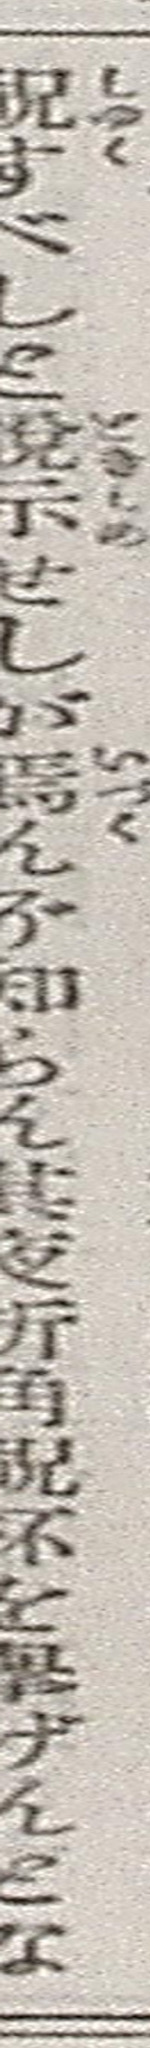祝すべしと説示せし焉んぞ知らん其夜折角祝杯を挙げんとな
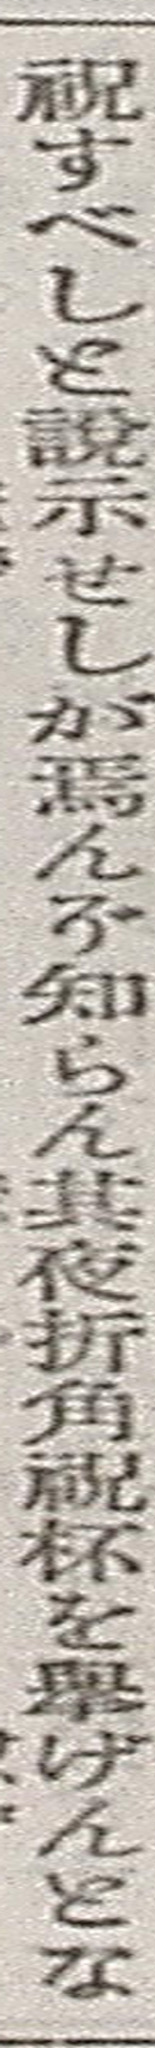祝すべしと説示せし焉んぞ知らん其夜折角祝杯を挙げんとな
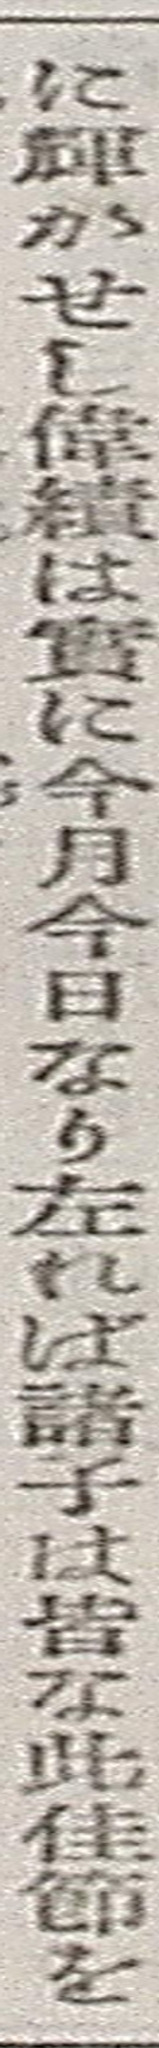に輝かせし偉績は実に今月今日なり左れば諸子は皆な此佳節を
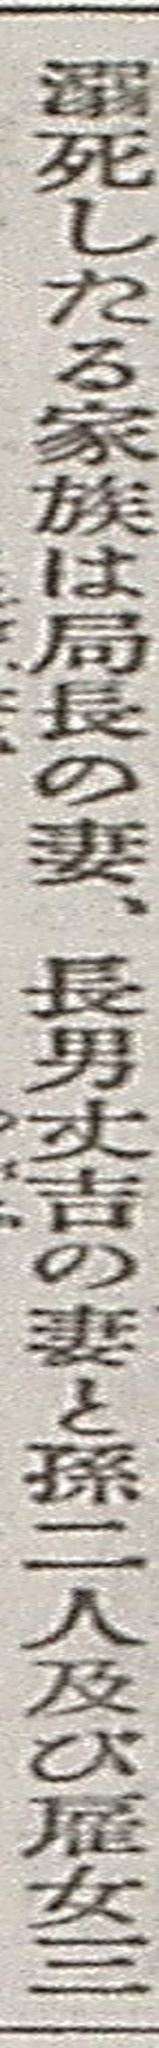溺死したる家族は局長の妻、長男丈吉の妻と孫二人及び雇女三
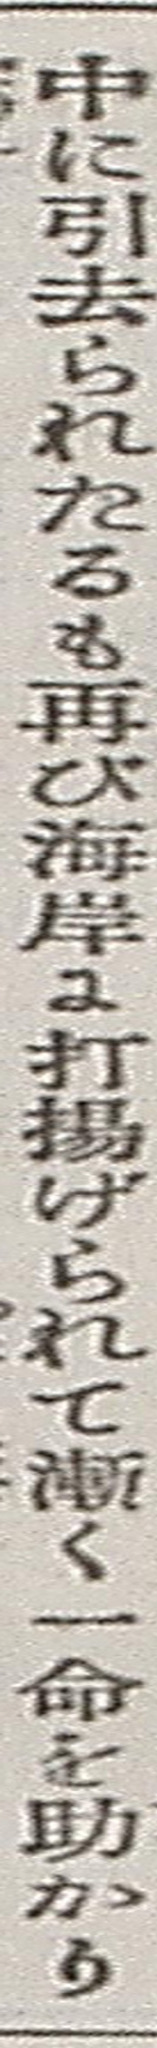中に引去られたるも再び海岸に打揚げられて漸く一命を助かり
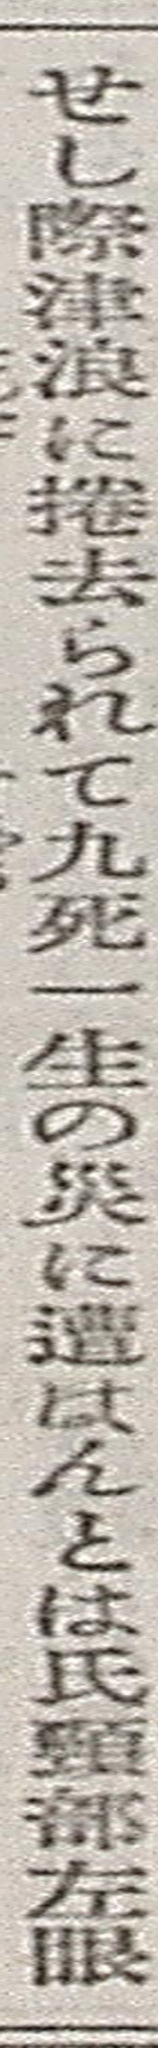せし際津浪に捲去られて九死一生の災に遭はんとは氏頸部左眼
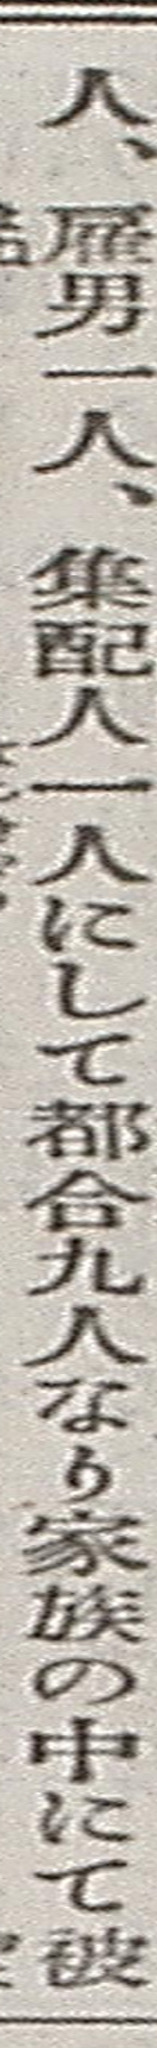人、雇男一人、集配人一人にして都合九人なり家族の中にて被
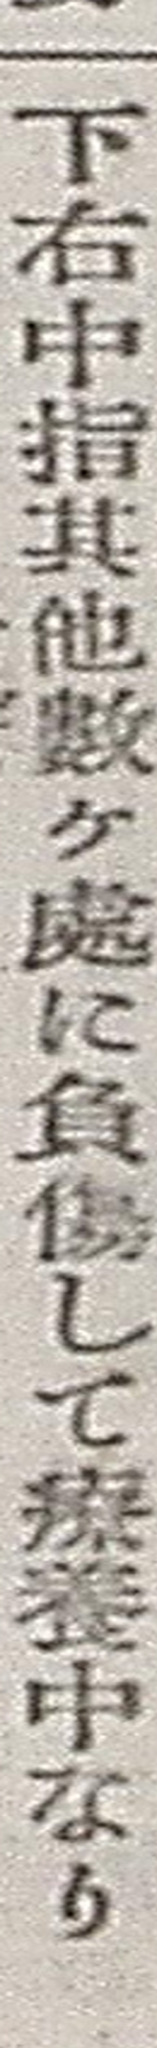下右中指其他数々処に負傷して療養中なり
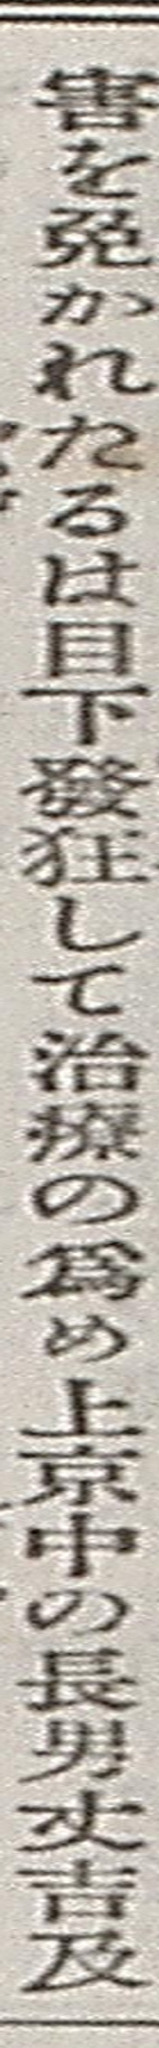害を免かれたるは目下発狂して治療の為め上京中の長男丈吉及
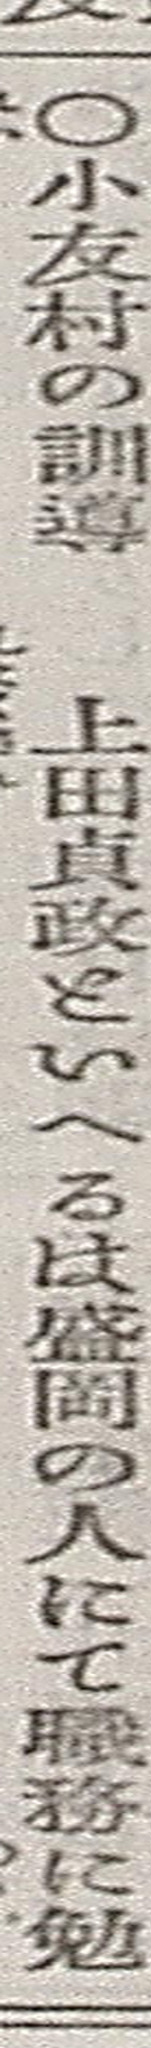○小友村の訓導上田貞政といへるは盛岡の人にて職務に勉
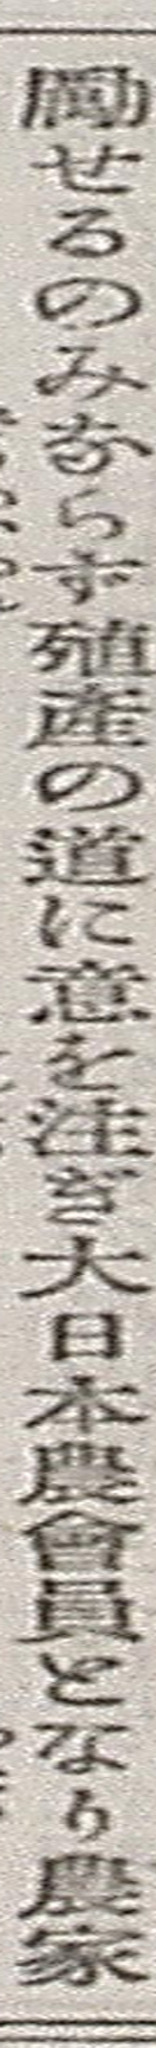励せるのみならず殖産の道に意を注ぎ大日本農会員となり農家
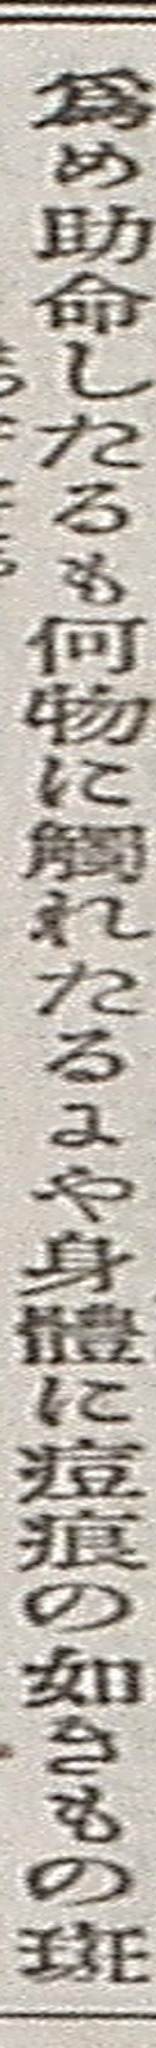為め助命したるも何物に触れたるにや身体に痘痕の如きもの斑
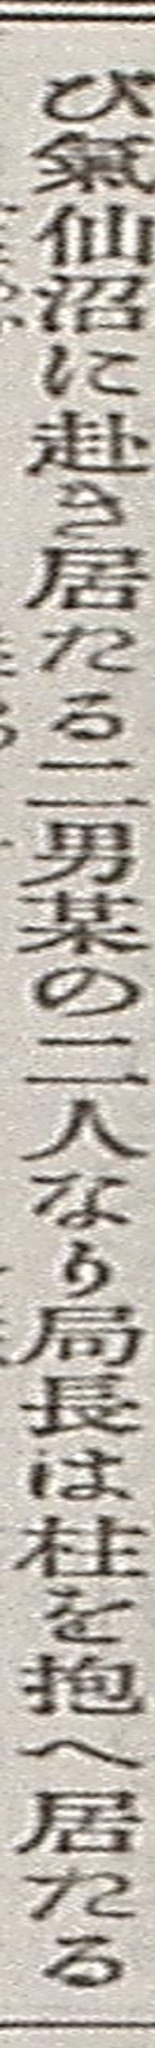び気仙沼に赴き居たる二男某の二人なり局長は柱を抱へ居たる
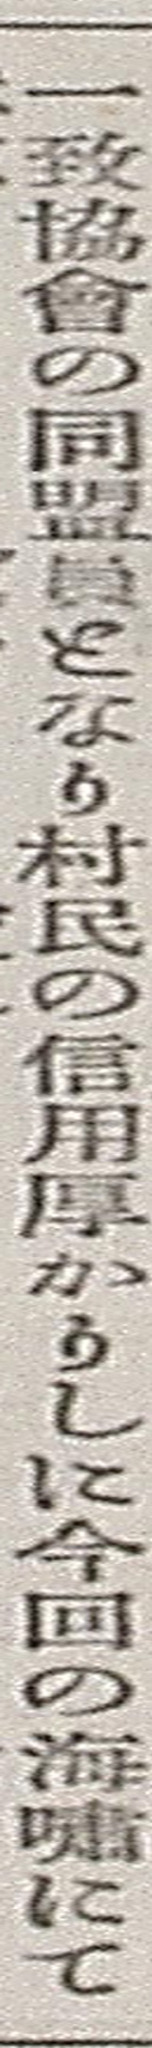一致協会の同盟員となり村民の信用厚かりしに今回の海嘯にて
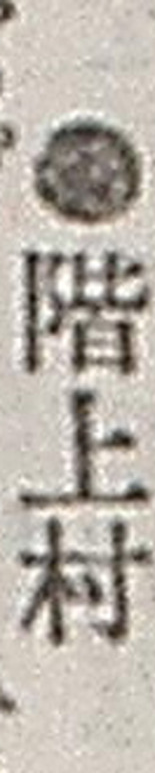●階上村
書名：風俗畫報臨時増刊第百二十號　大海嘯被害録（下）
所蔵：東京大学地震研究所図書室 Earthquake Research Institute Library, The University of Tokyo, JAPAN
